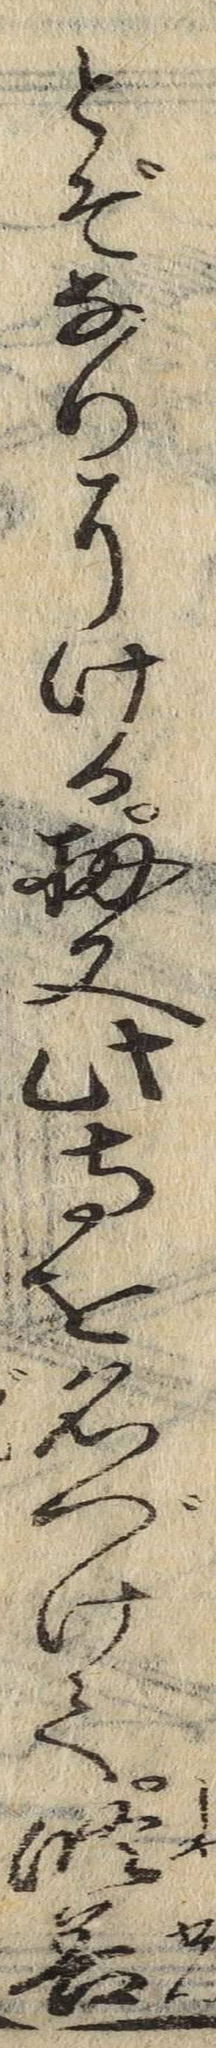とぞなりにける。扨又此寺を名づけて。修善
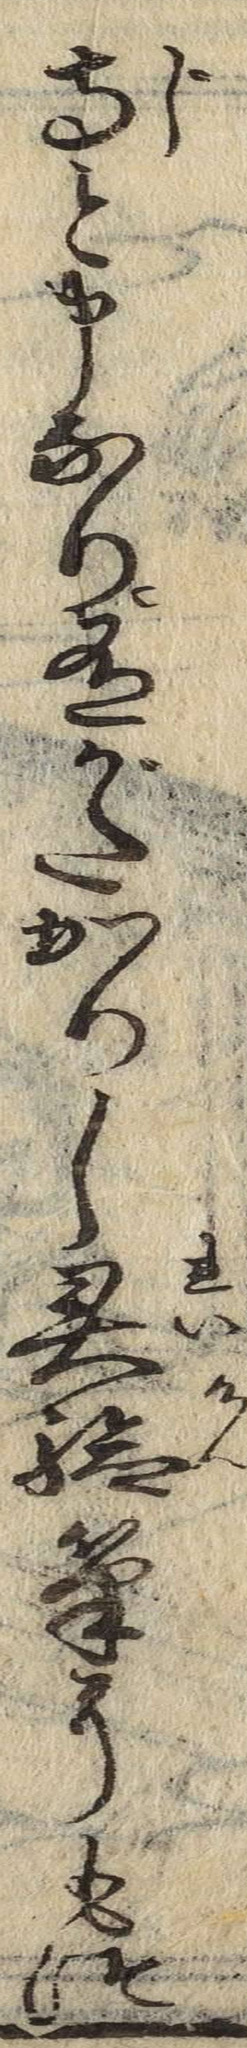寺と申なり。有がたかりし霊験筆にもつ
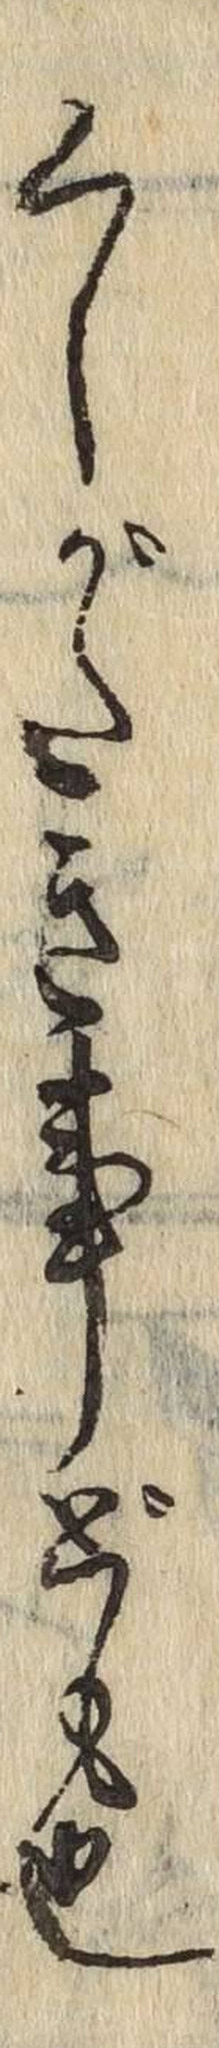くしがたき事ども也

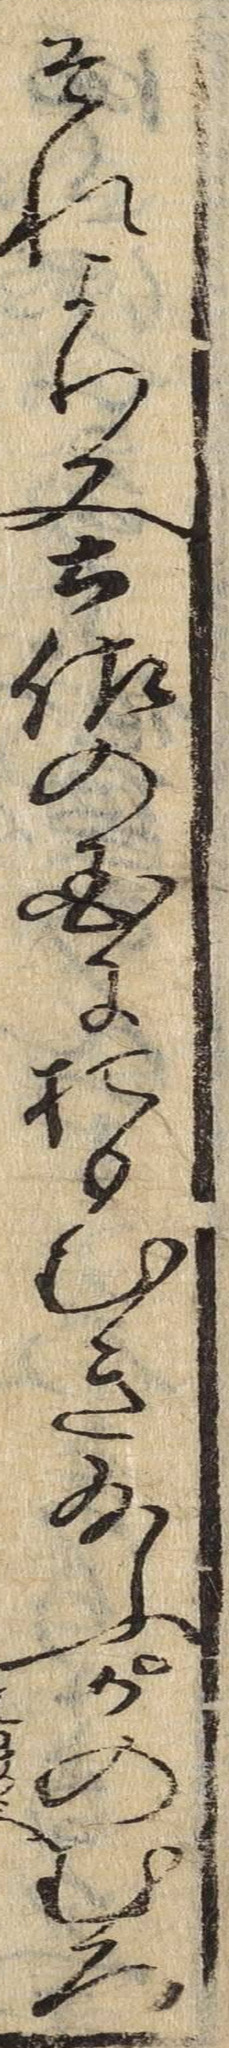それより又土佐の国におもむき給ふ。かのむろ
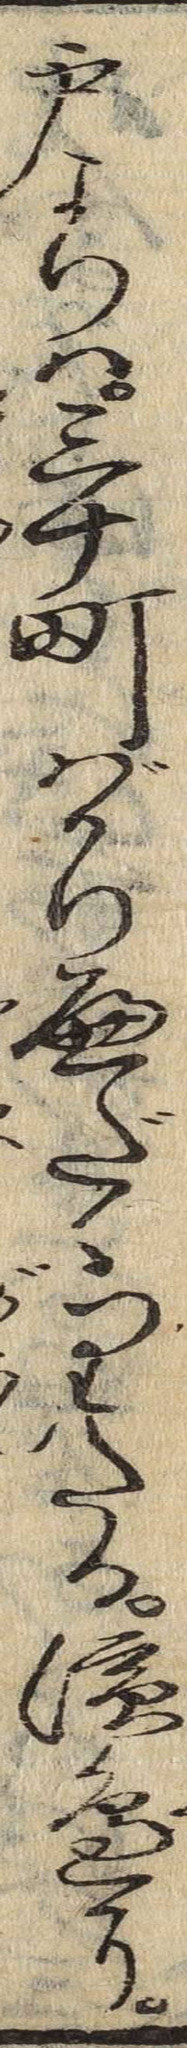戸よりは。三十町はかりへたゝりたる。浜辺に。
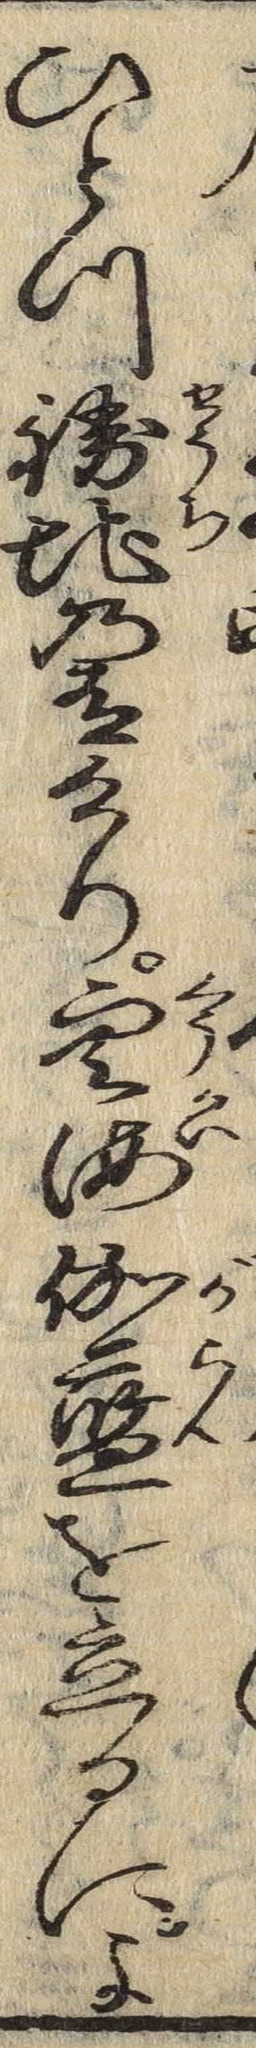ひとつ勝地の有けり。空海伽藍を立るによ
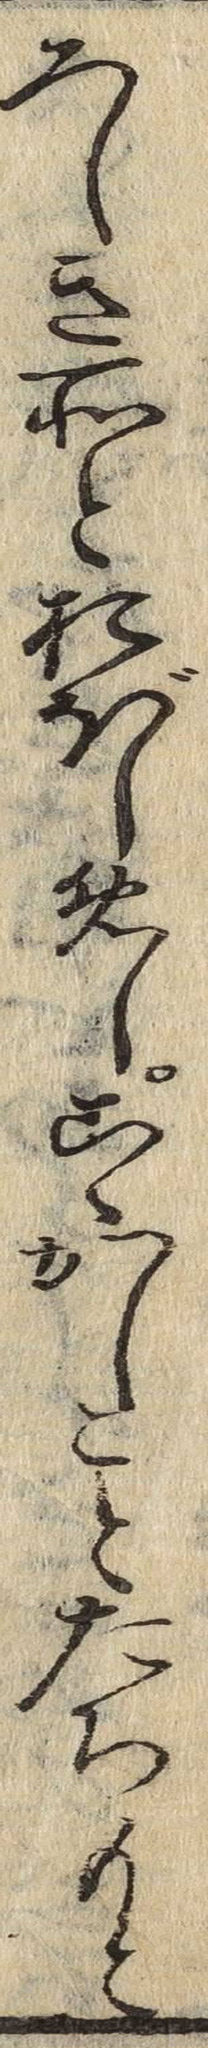ろしき所とおぼしめし。こゝかしことたちもと
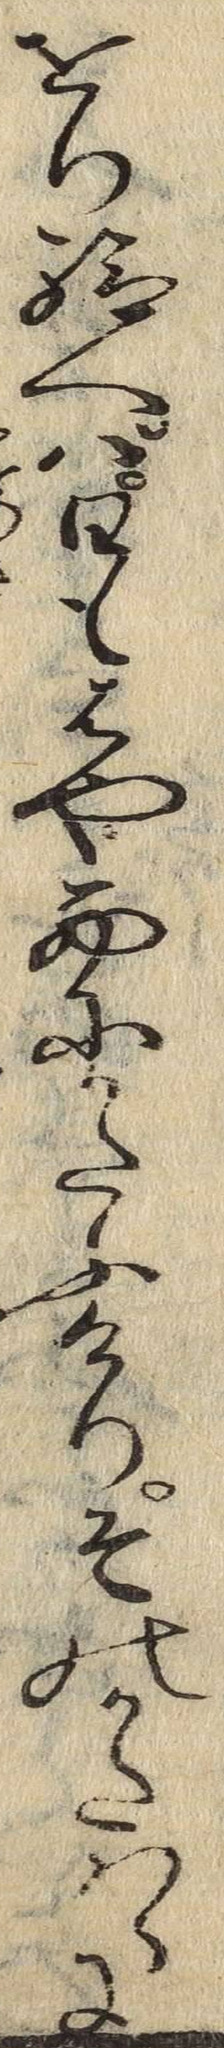をり給へは。日もはや西にかたふけり。そのかたはらに
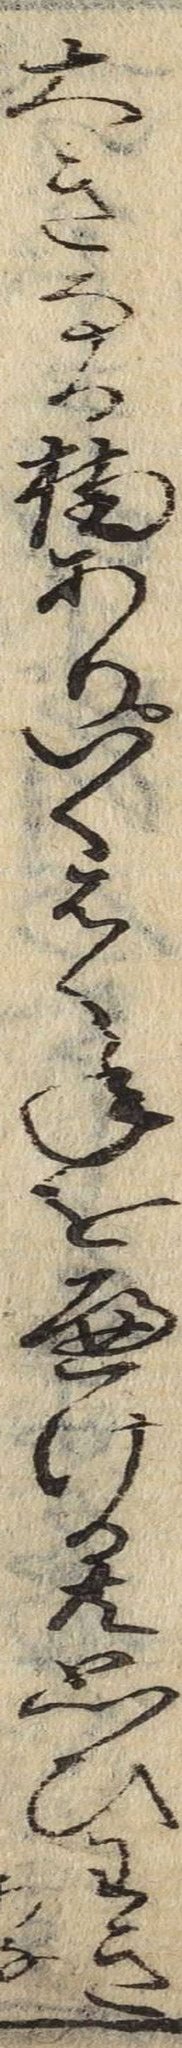大きなる楠あり。いくはく年をへける共思ひわき
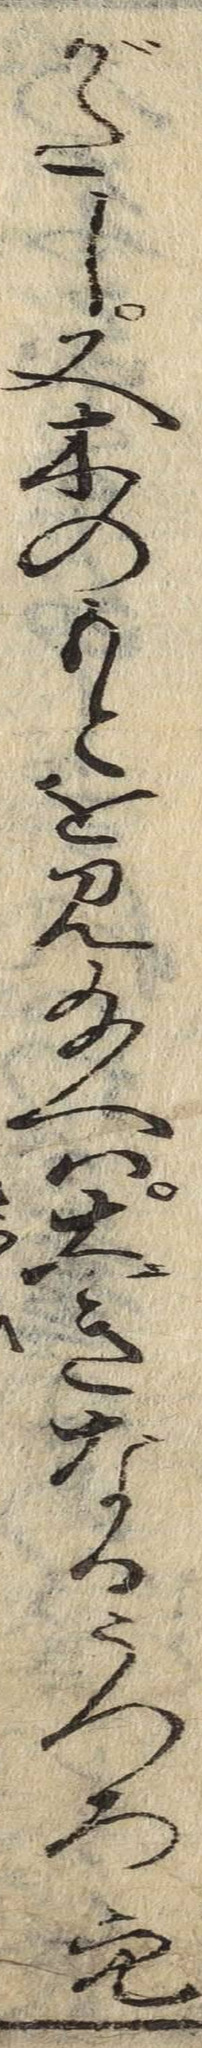がたし。又木のもとを見たまへは。大きなるうつろ穴
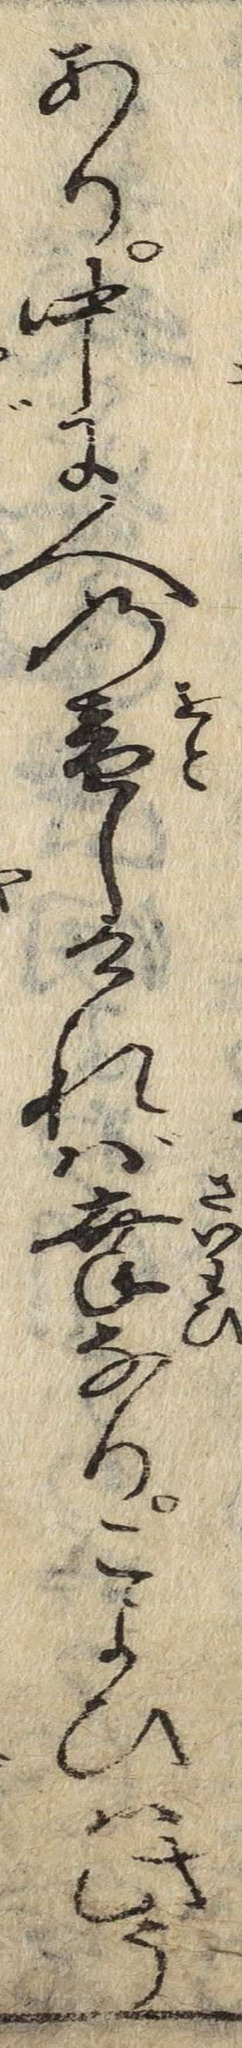あり。中に人の音しければ幸なり。こよりは此う
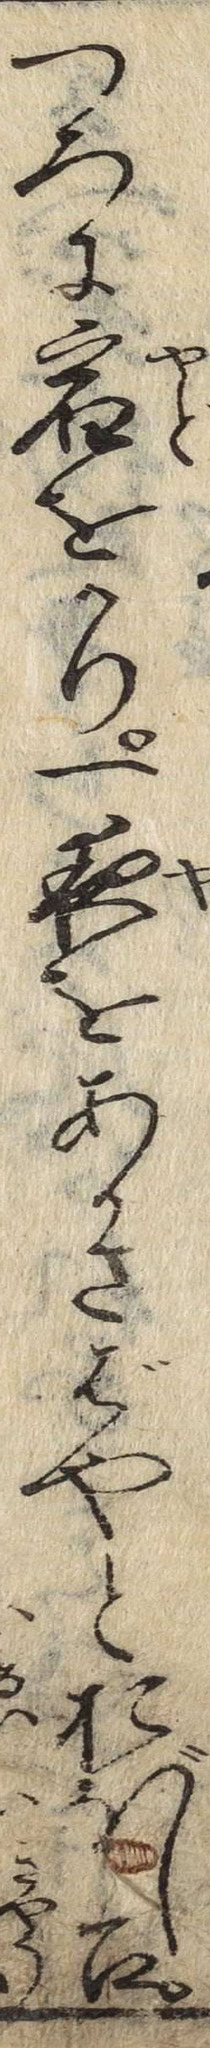つろに宿をかり。一夜をあかさばやとおぼし召。
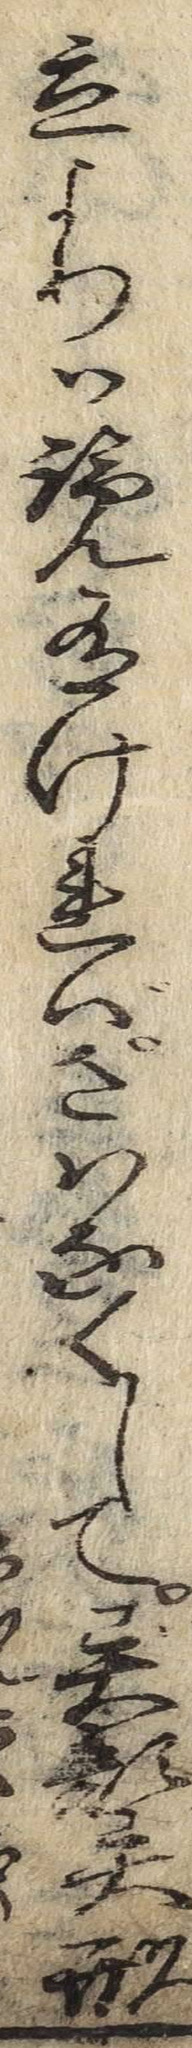立より御覧有ければ。さはなくして。異類異形
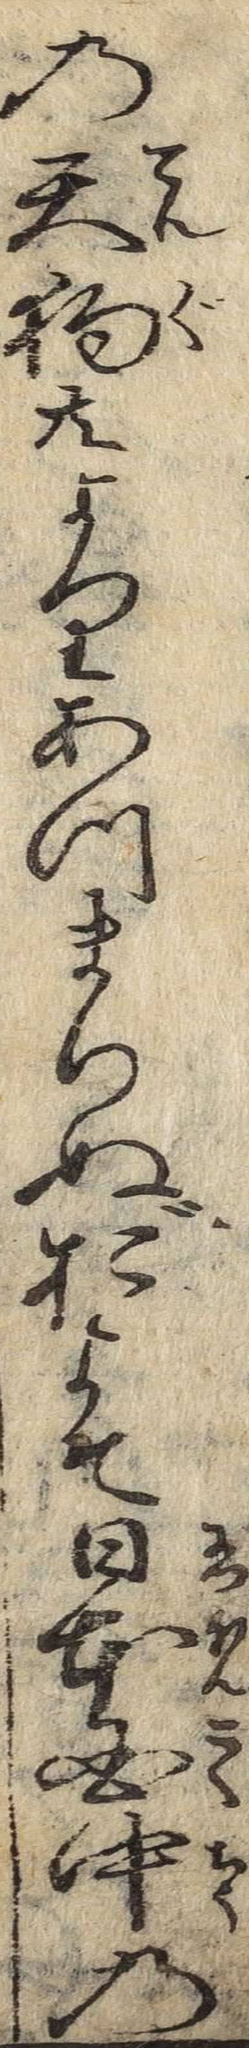の天狗共よりあつまりぬ。およそ日本国中の

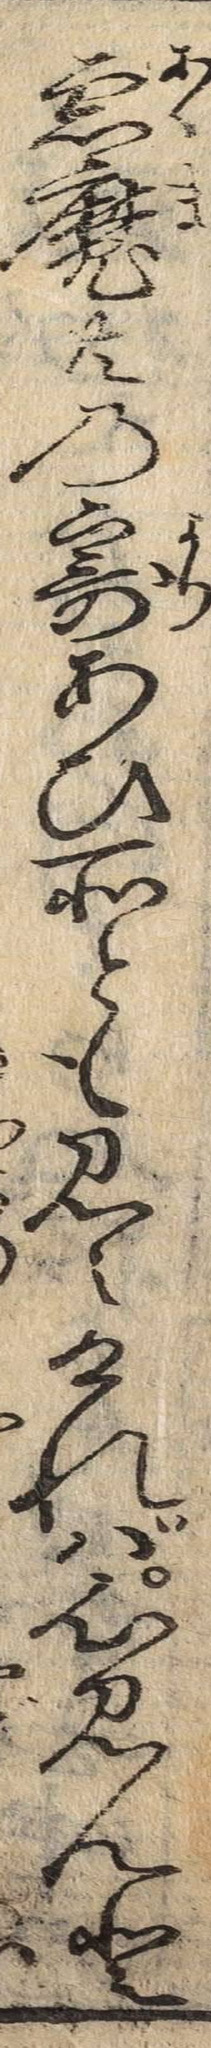悪魔共の寄あひ所とも見えければ。こゝろ見んと
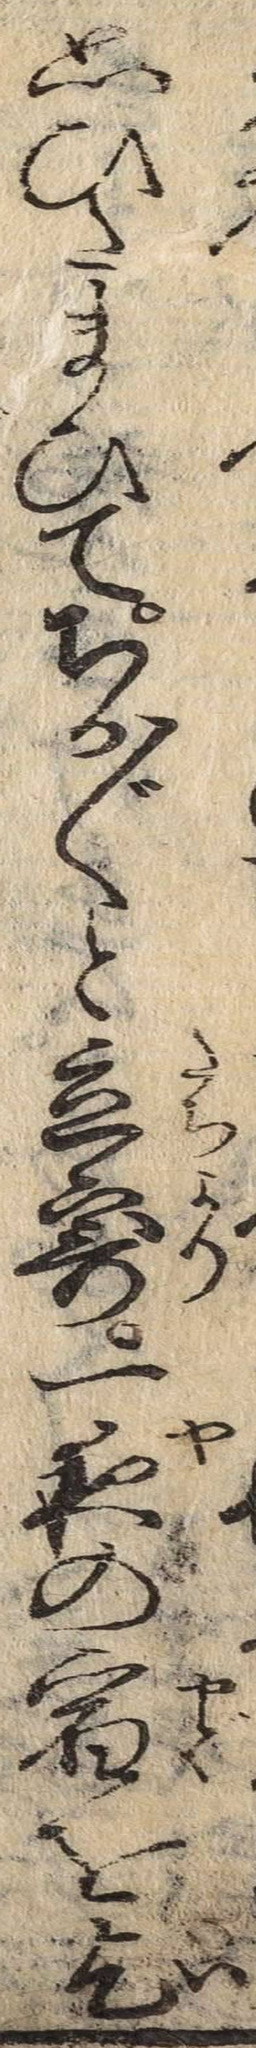思ひたまひて。ちか〴〵と立寄。一夜の宿を乞
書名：弘法大師御傳記
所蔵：京都府立京都学・歴彩館 国文学研究資料館
